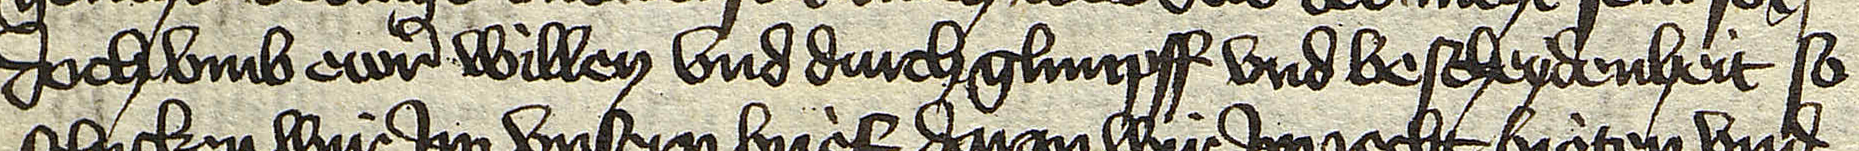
doch vmb willen vnd durch glimpff vnd beſcheydenheit ſo
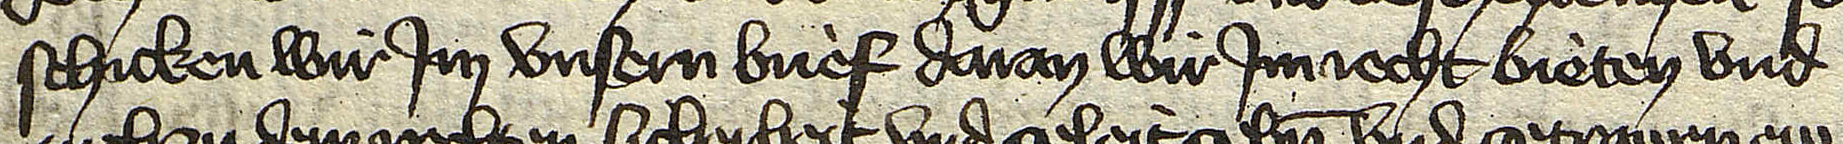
ſchicken wir Im vnſern brief daran wir Im recht bieten vnd
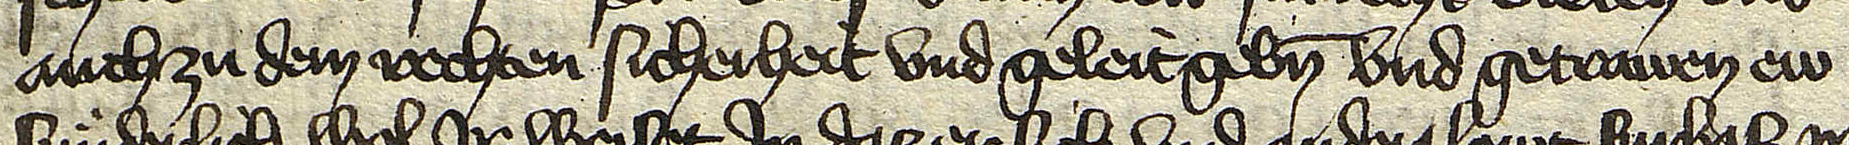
auch cʒu dem rechten ſicherheit vnd geleit gebn* vnd getrawen ew
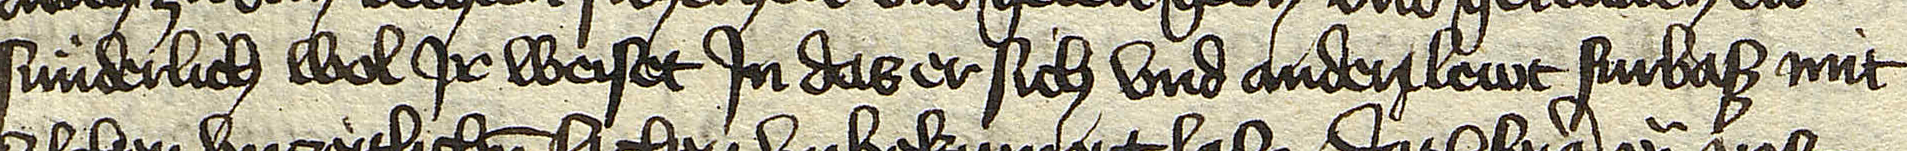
ſünderlich wol Ir weiſet In das er ſich vnd andern lewt furbaſʒ mit
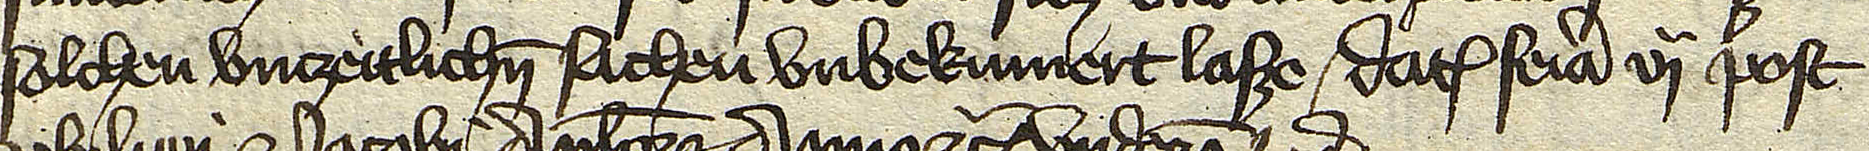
ſolchen vncʒeitlichn* ſachen vnbekumert laſʒe / dat* feia* vi* poſt
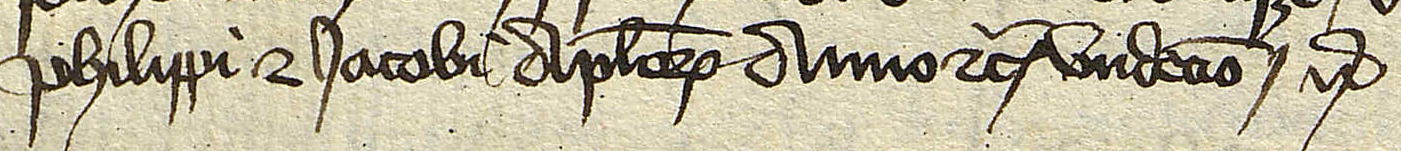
Philippi @ Iacobi Aplo* Anno ec* vndecio* / §
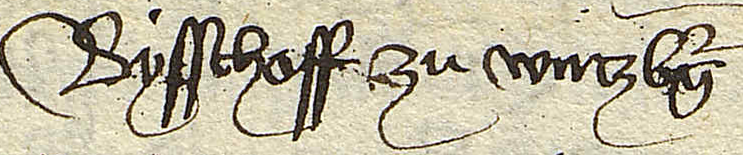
Byſſchoff cʒu wircʒbg*
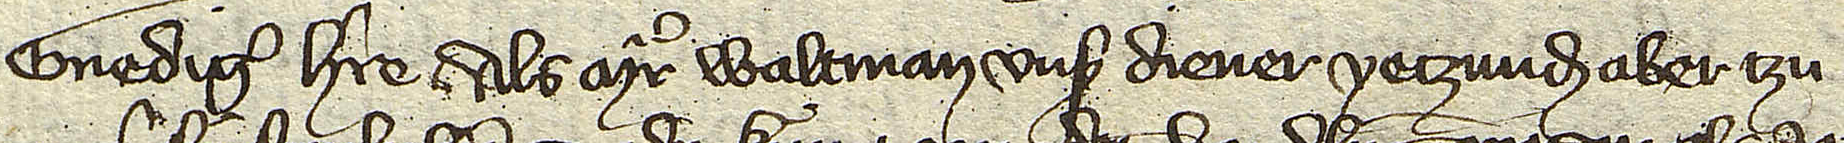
Gnedig* h*re / Als Mr* Waltman vnſ* diener yecʒund* aber cʒu
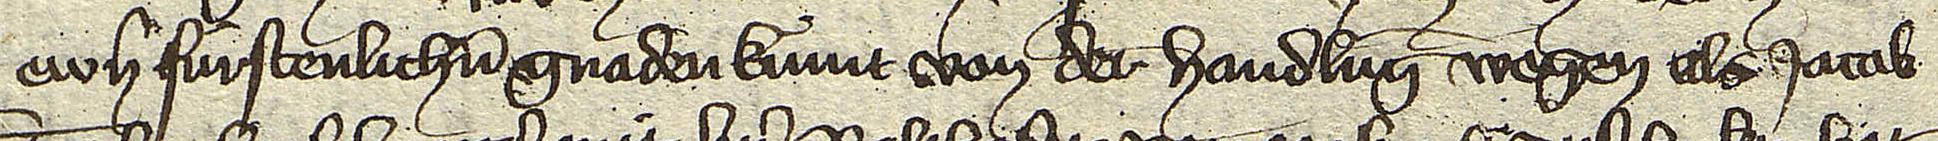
ewn* fürſtenlichn* gnaden kümt von der handlug* wegen als Iacob
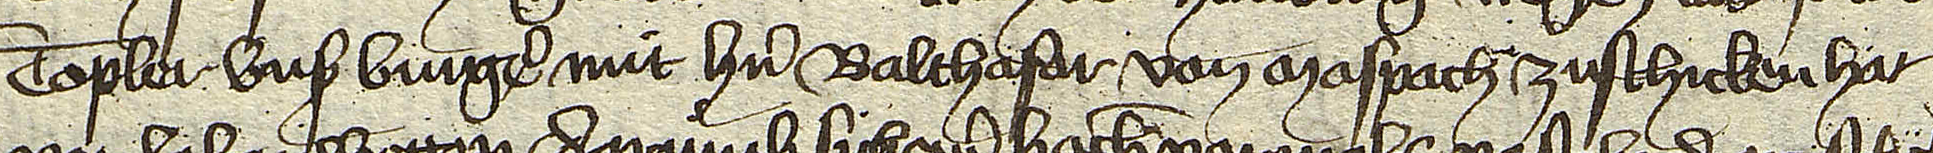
Topler vnſ* burge* mit hn* Balthaſar von Maſpach cʒuſchicken hat
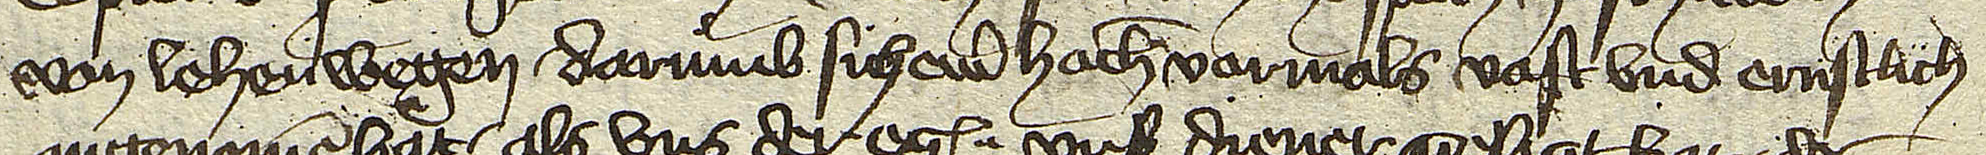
von lehen wegen / darümb ſich ew* hoch* vormals vaſt vnd ernſtlich
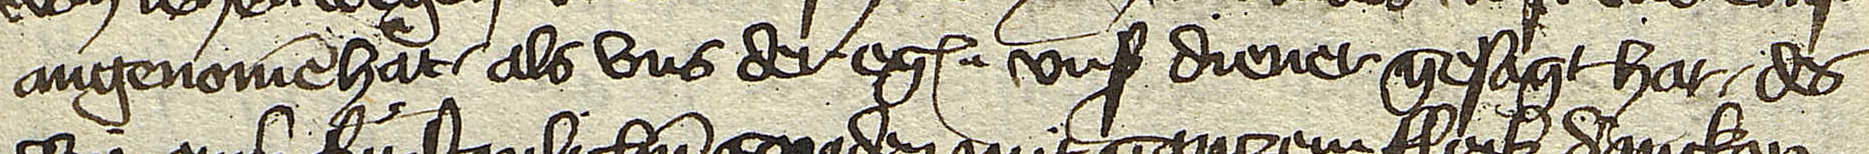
angenome* hat / als vns der eg* ~ vnſ* diener geſagt hat / des
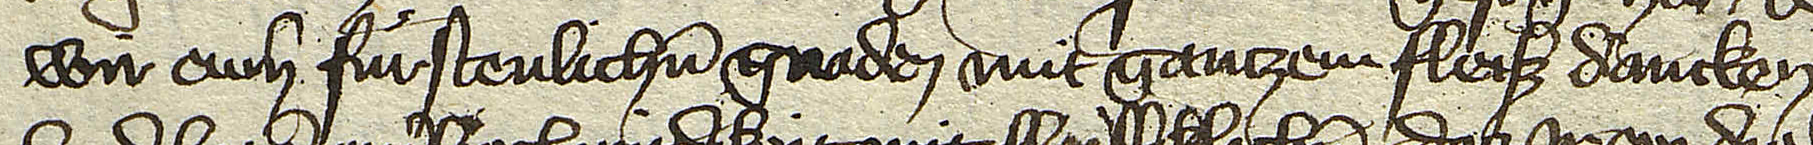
wir ew*n fürſtenlichn* gnaden mit gancʒem fleiſʒ dancken
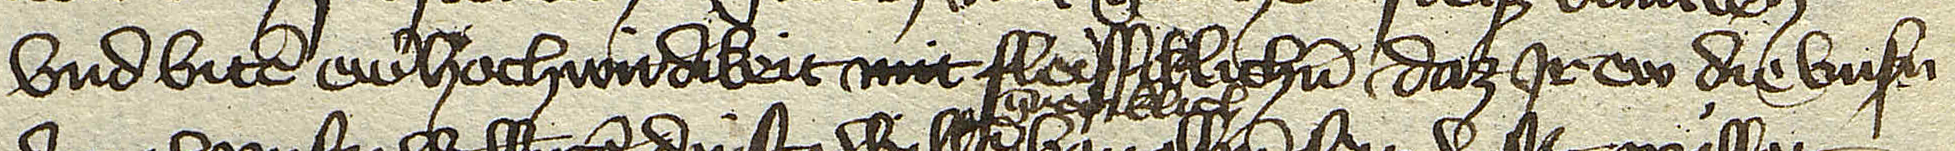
vnd bite* ew* hochwirdikeit mit fleiſſiklichn* / daʒ Ir ew die vnſ*n
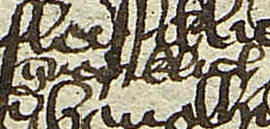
gnediklich
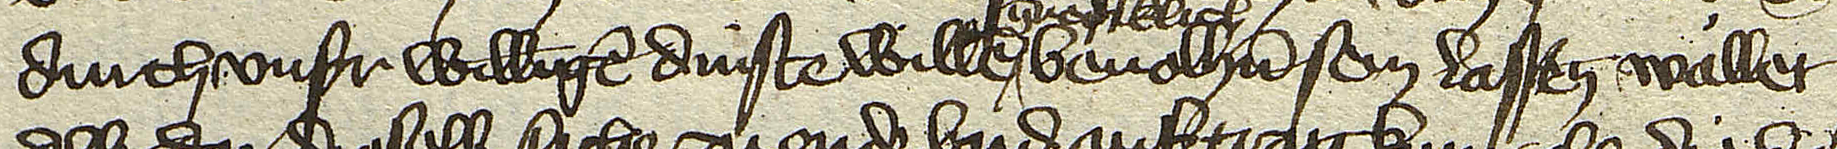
durch vnſ*r willige* dinſte wille* beuolhn* ſein laſſen wöllet
